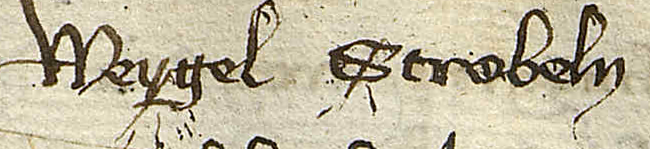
Weygel Strobeln
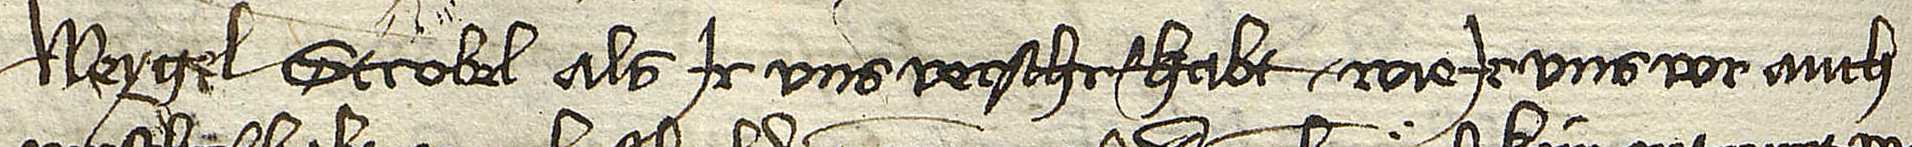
Weygel Strobel als Ir vns verſchr* habt / wie Ir vns vor auch
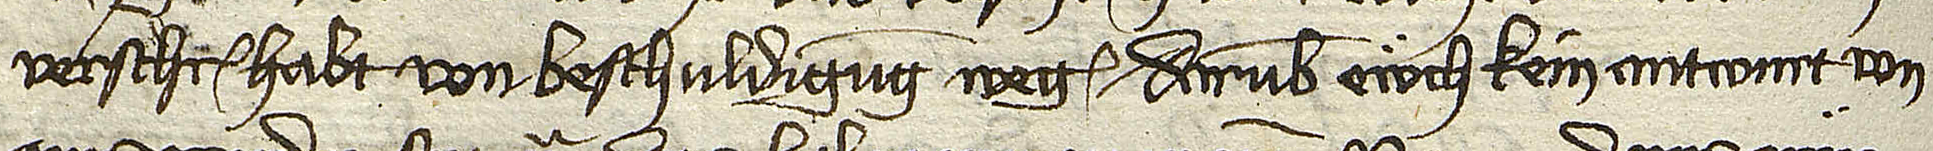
verſchr* habt von beschuldigug* weg* / darub* ewch kein antwurt von
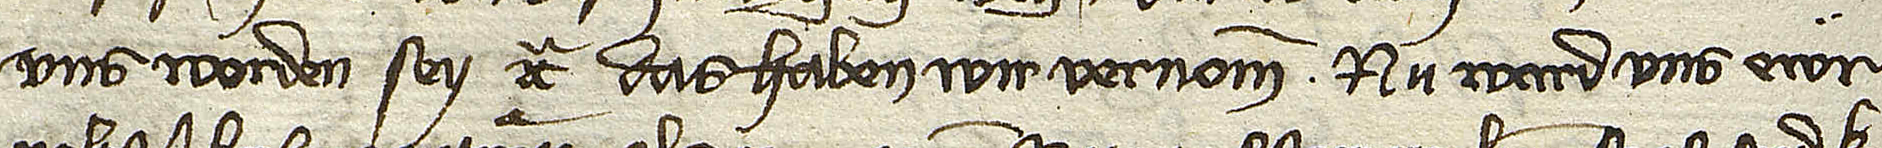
vns worden ſey ec* das haben wir vernom* . Nu ward vns ewr
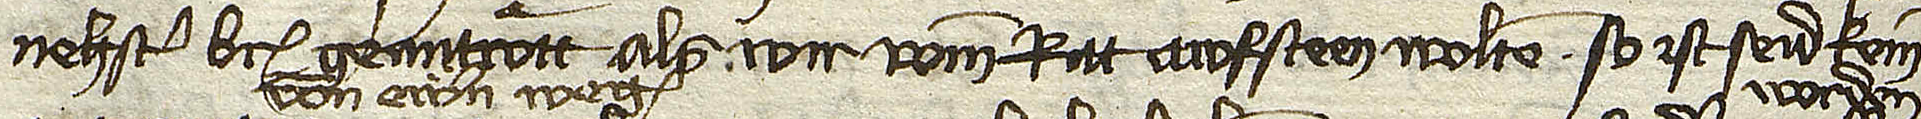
nehſt* br* geantw*tt als wir vom* Rat awfſteen wolte* . ſo ist ſeid kein
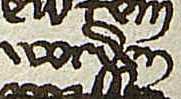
worden
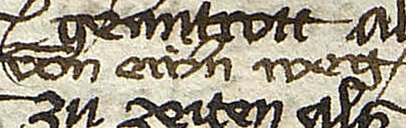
von ew*n weg*
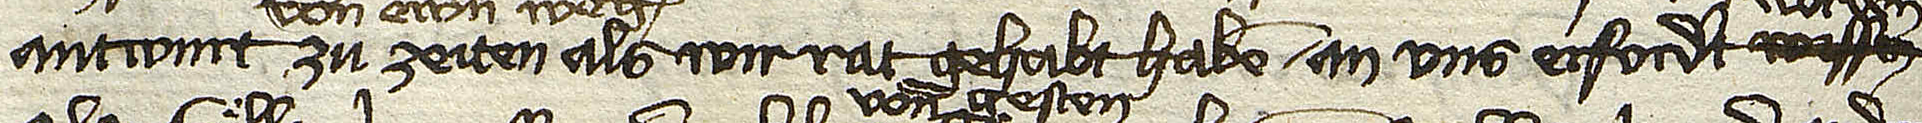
antwurt ʒu ʒeiten als wir rat gehabt habe* / an vns erfordt* wiſſen
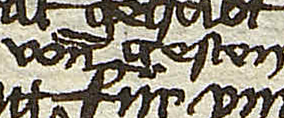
von geſten
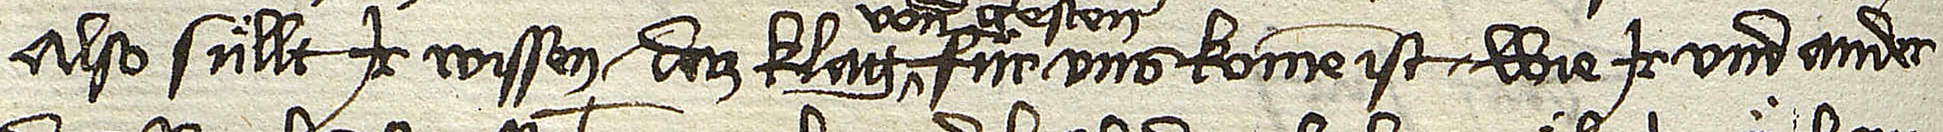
Alſo ſüllt Ir wiſſen / daʒ klag für vns kome* iſt / Wie Ir vnd ander
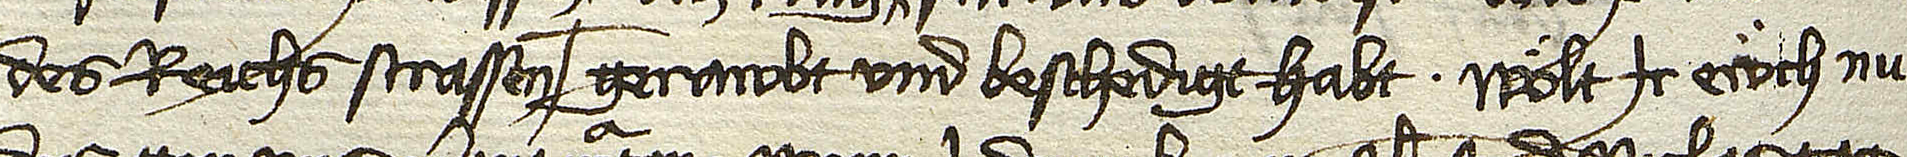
des Reichs ſtraſſen gerawbt vnd beſchedigt habt . wölt Ir ewch nu
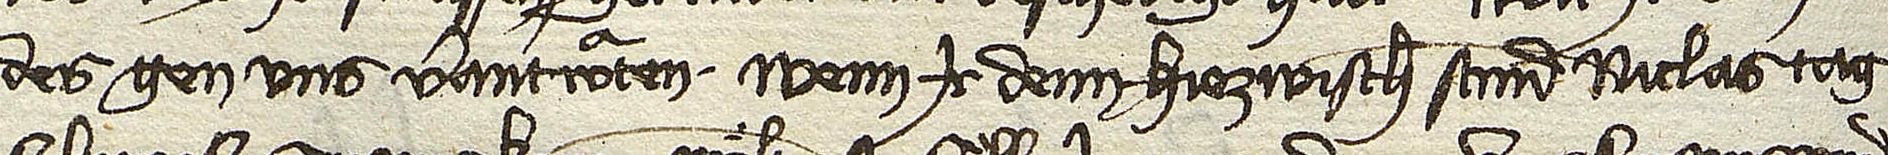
des gen vns v*antw*ten . wenn Ir denn hieʒwiſch* ſand Niclas tag
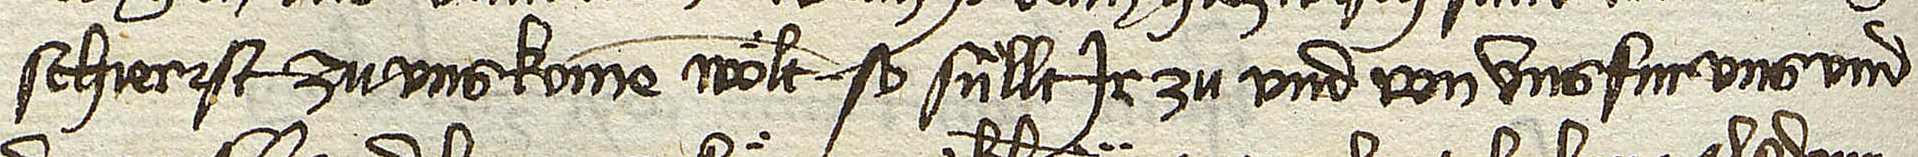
ſchieriſt ʒu vns kome* wölt . ſo ſüllt Ir ʒu vnd von vns fur vns vnd
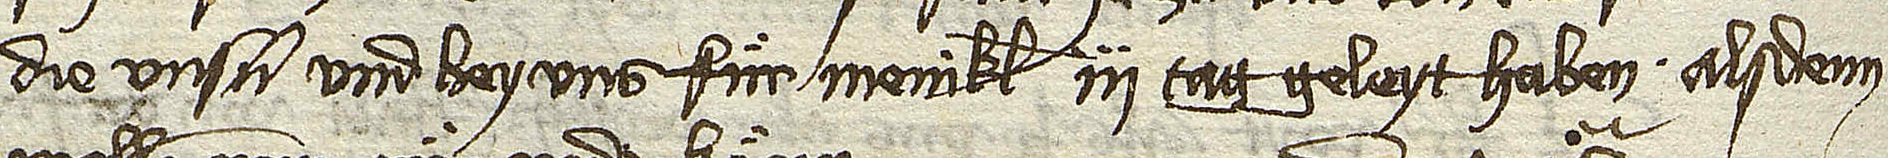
die vnſn* vnd bey vns für menikl* iii tag geleyt haben . alſdenn
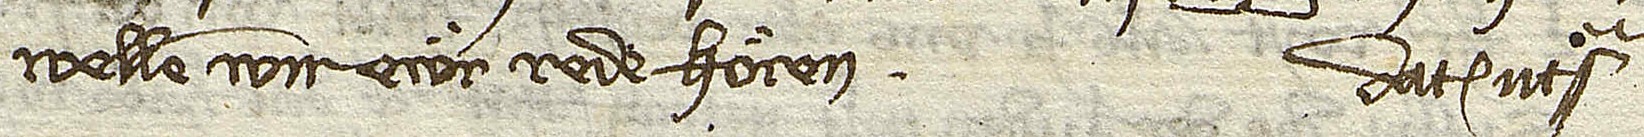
welle* wir ewr rede hören . dat* ut ſ*
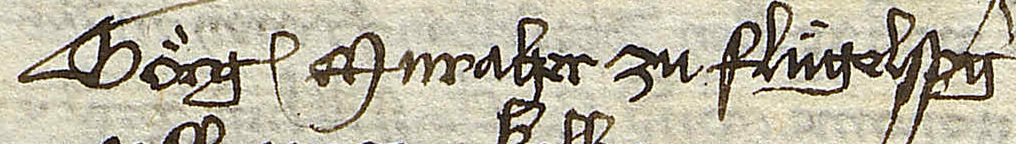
Görg* Muraher ʒu flügelſp*g
